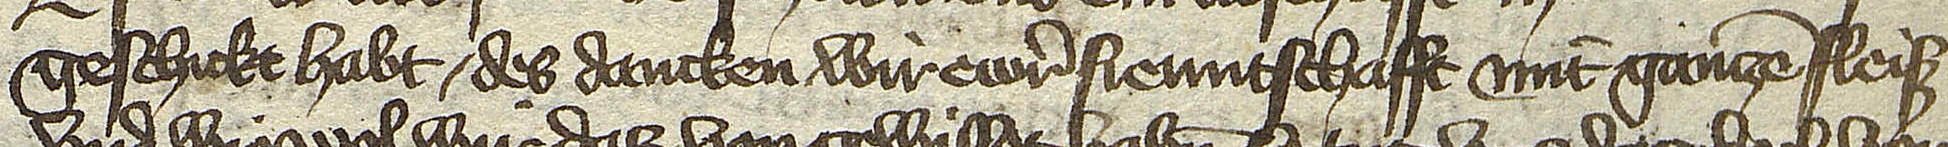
geſchickt habt / des dancken wir ewr* freuntſchafft mit gancʒe* fleiſʒ
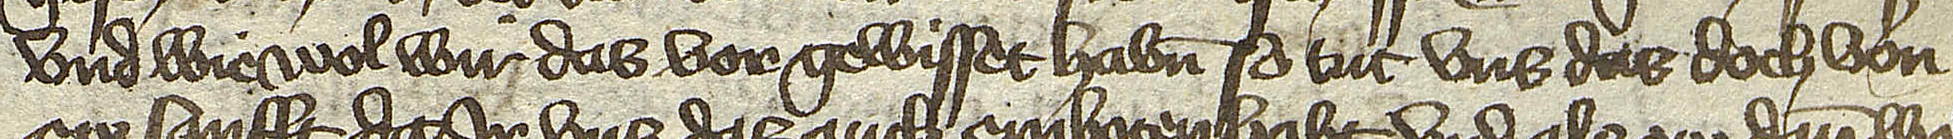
vnd wie wol wir das vor gewiſſet habn* ſo tut vns das doch von
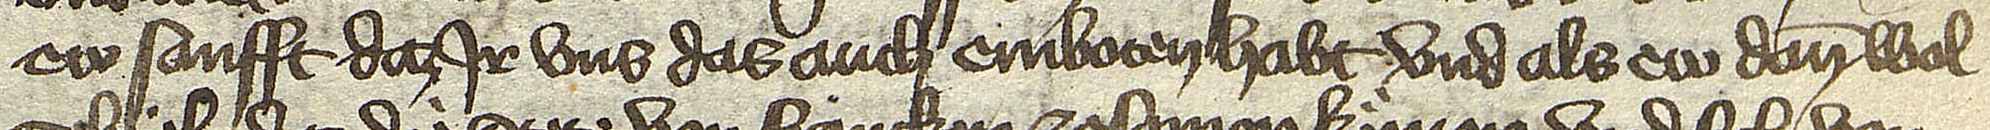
ew ſanfft daʒ Ir vns das auch emboten habt vnd als ew dan* wol
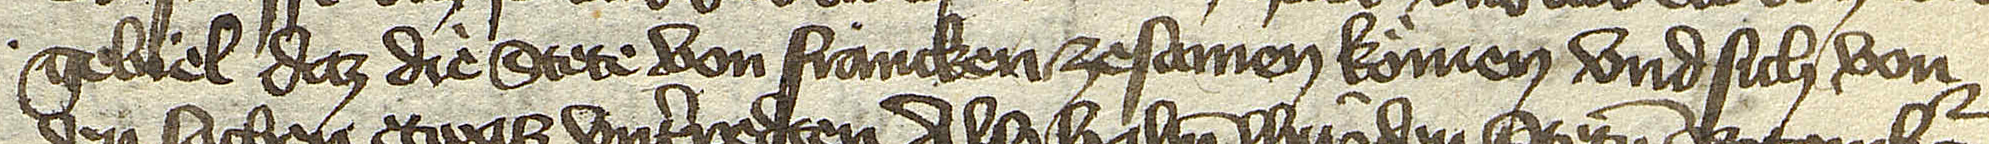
geviel daʒ die Stete von francken cʒeſamen kömen vnd ſich von
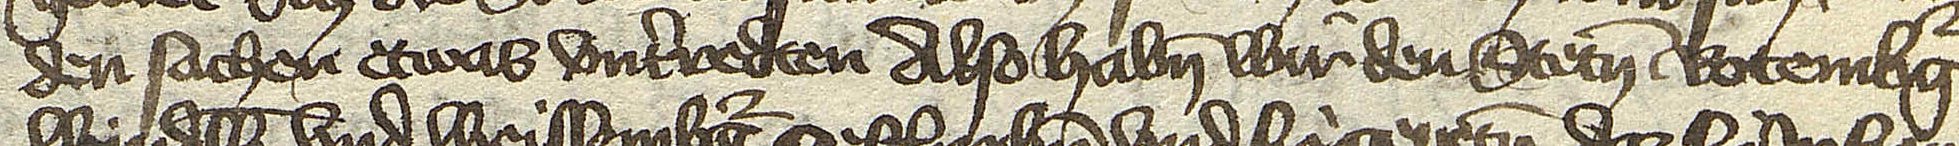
den ſachen etwas vnt*redten Alſo habn* wir den Stetn* Rotemb*g
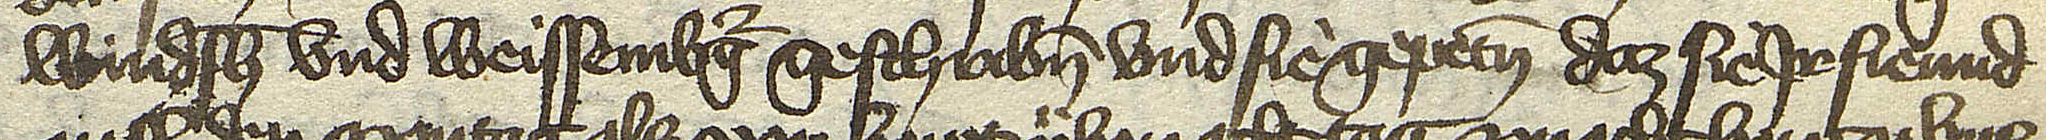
windſh* vnd weiſſemb*g geſchribn* vnd ſie gepetn* daʒ ſie Ir freund
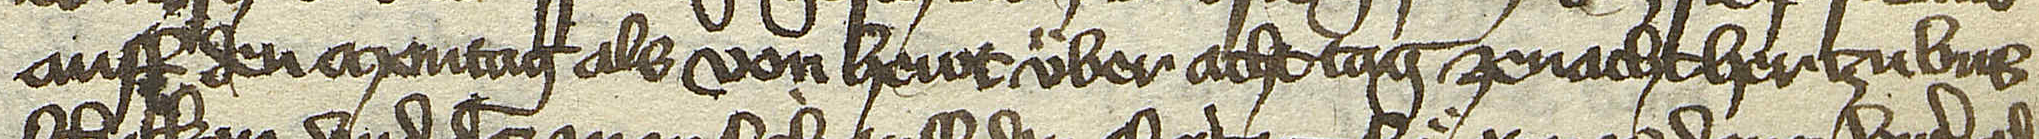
auff den Montag als von hewt v̈ber acht tag cʒenacht her cʒu vns
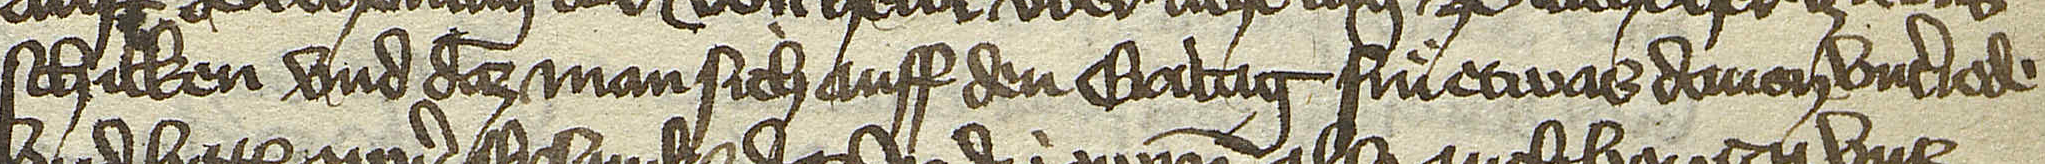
ſchicken vnd daʒ man ſich auff den Eritag frü etwas dauon vnt*rede
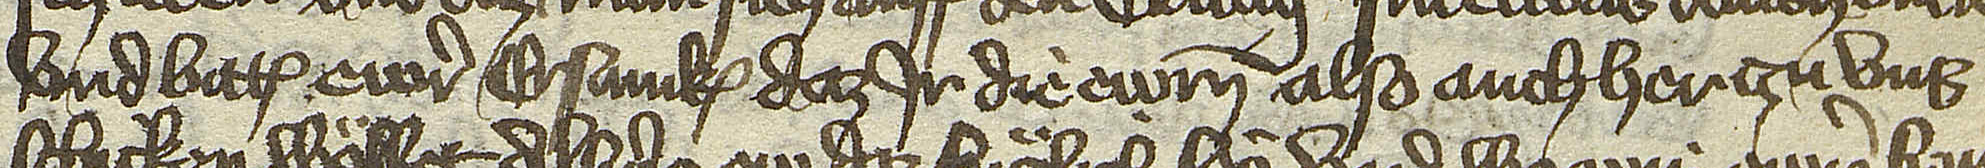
vnd bitt* ewr* Erſamk* daʒ Ir die ewrn* alſo auch her cʒu vns
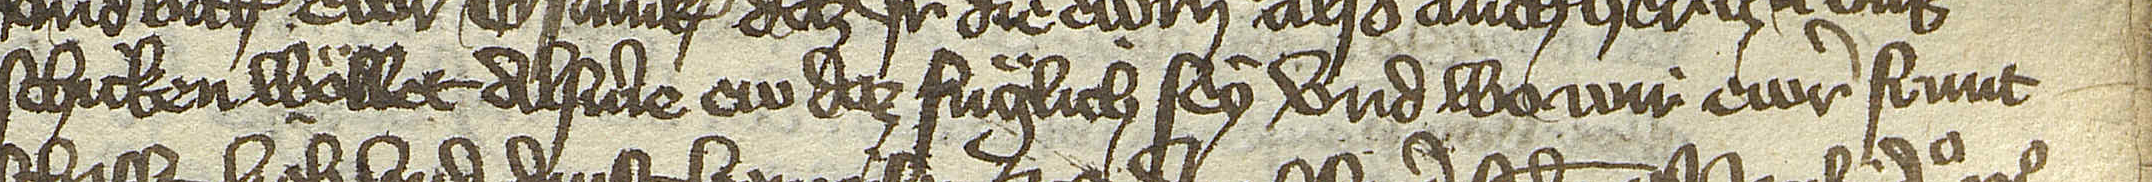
ſchicken wöllet alſu*e ew daʒ füglich ſey vnd wo wir ewr* frunt -
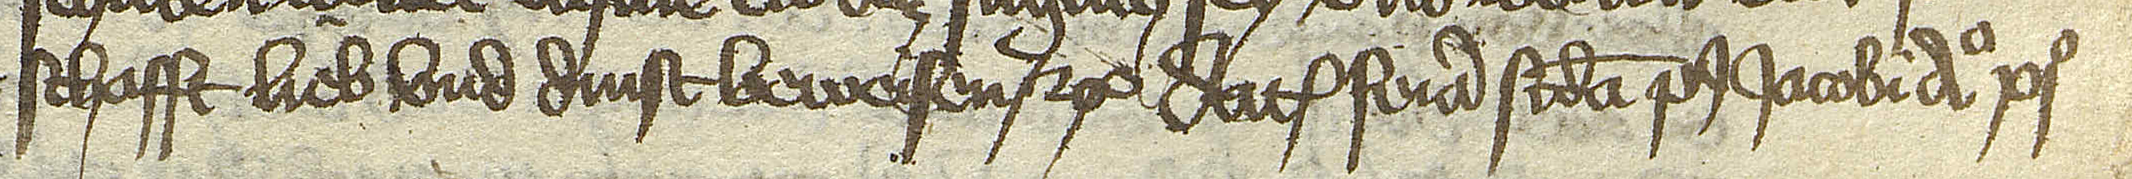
ſchafft lieb vnd dinſt beweiſen / ec* dat* feia* ſcda* p* Iacobi A* xi*
